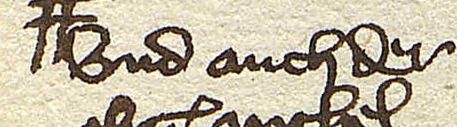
vnd auch der
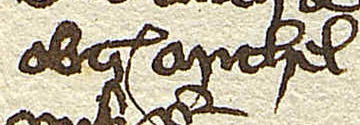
obg* Michel
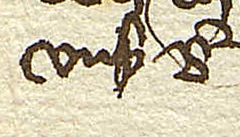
vnſ* B*
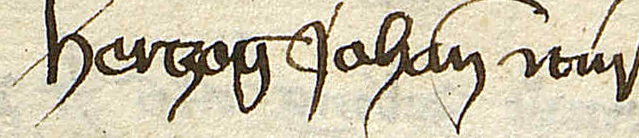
Hercʒog Iohan* itm*
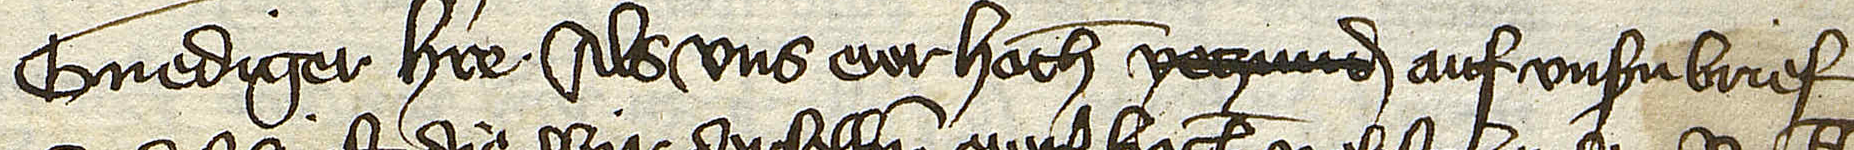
Gnediger h*re . Als vns ewr hoch* yecʒund* auf vnſ*n brief
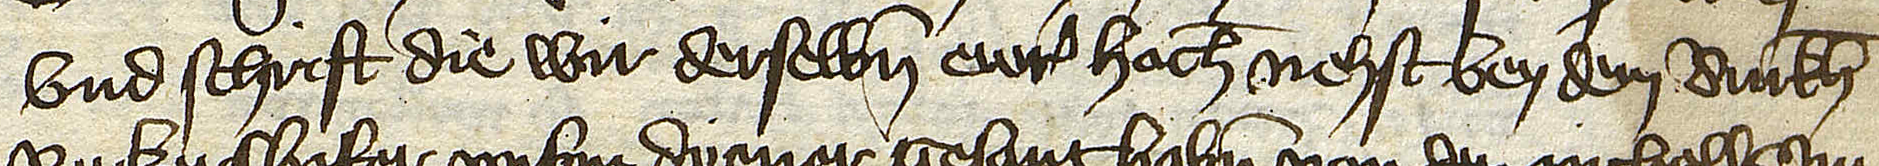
vnd ſchrift die wir derſelb*n ew*r hoch* nehſt bey dem Burkh*
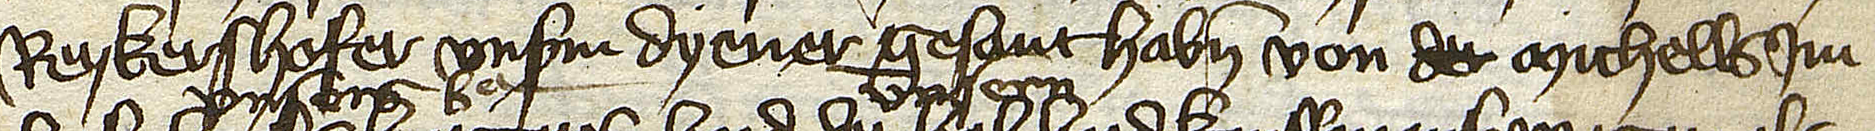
Reykerſhofer vnſ*m dyener geſant hab*n von der Michell Im
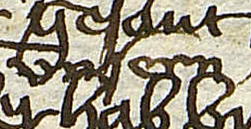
vnſern
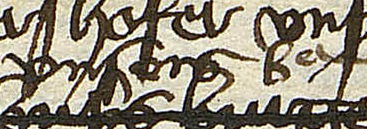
vnſers b*
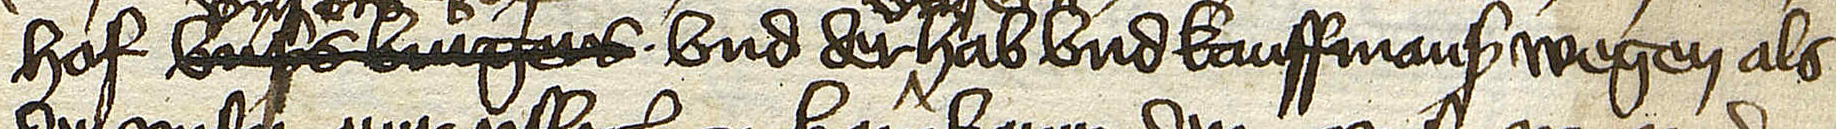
hof vnſ*s burgers . vnd der hab vnd kauffmanſ* wegen als
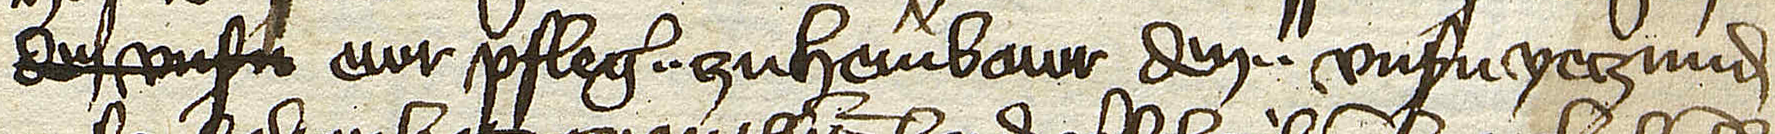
den vnſ*n ewr pfleg* ~ cʒu hembaur den ~ vnſ*n yecʒund*
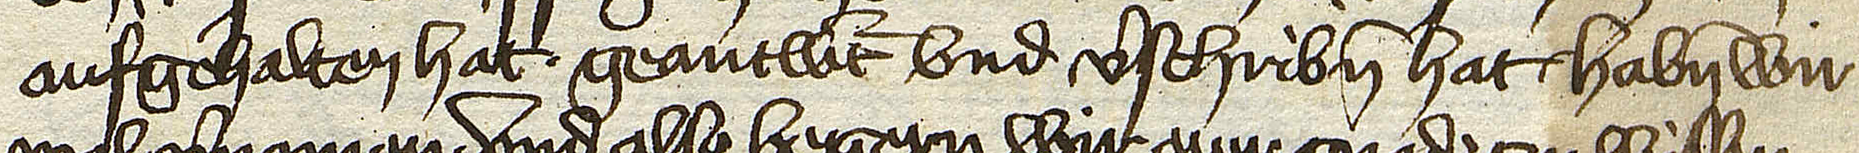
aufgehalten hat . geantw*t vnd v*ſchrib*n hat / hab*n wir
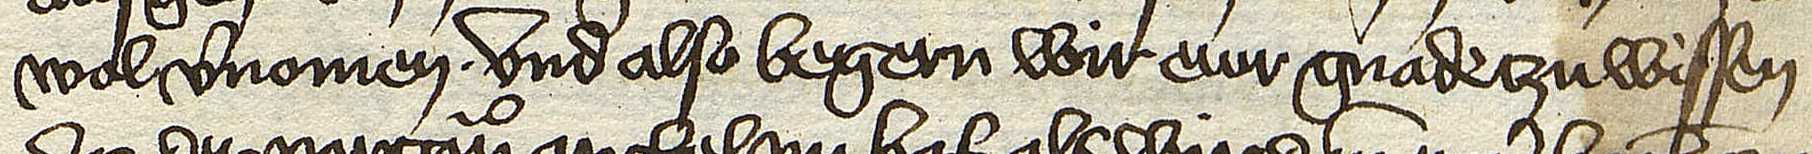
wol v*nomen . Vnd alſo begern wir ewr gnade cʒu wiſſen
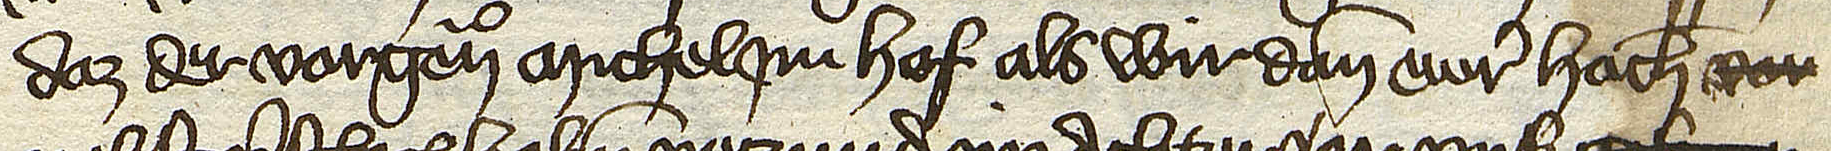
daʒ der vorgen* Michel Im hof als wir dan* ew*r hoch* von
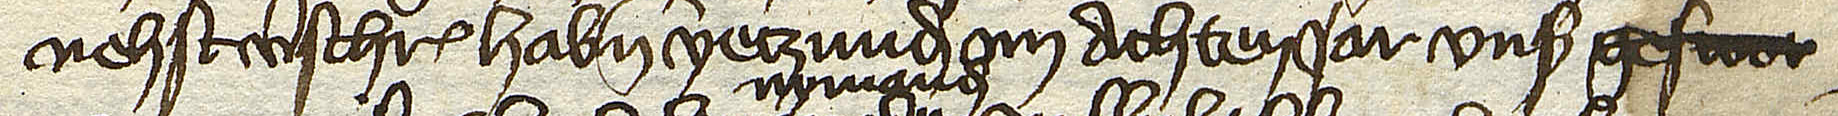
nehſt v*ſchr* hab*n yecʒund* im Achten Iar vnſ* geſwor
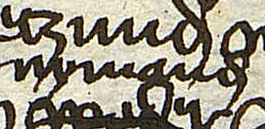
nymand*
